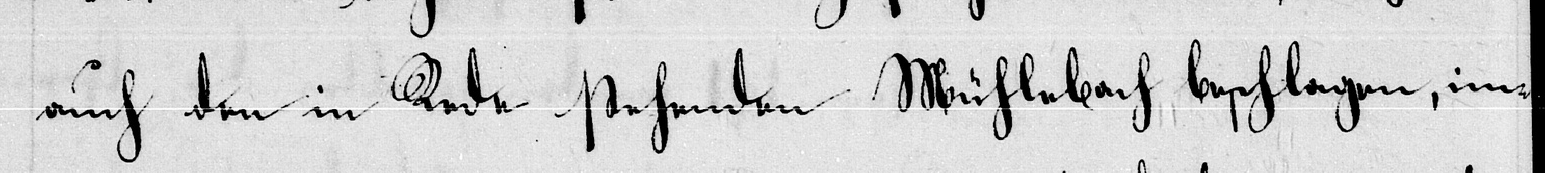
auch den in Rede stehenden Mühlebach beschlagen, im¬
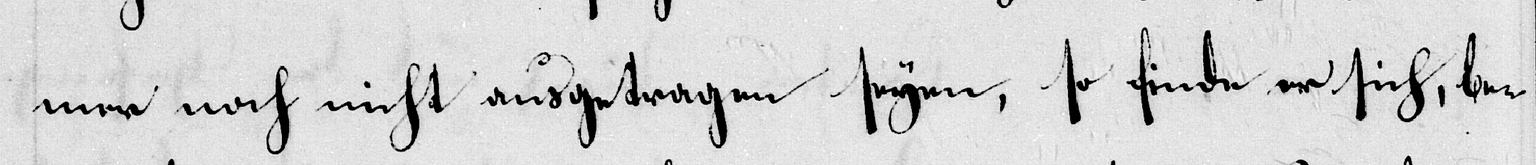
mer noch nicht ausgetragen seyen, so finde er sich, be¬
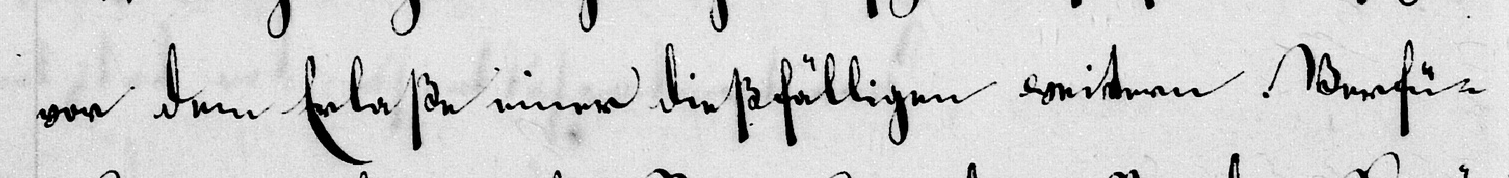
vor dem Erlaße einer dießfälligen weitern Verfü¬
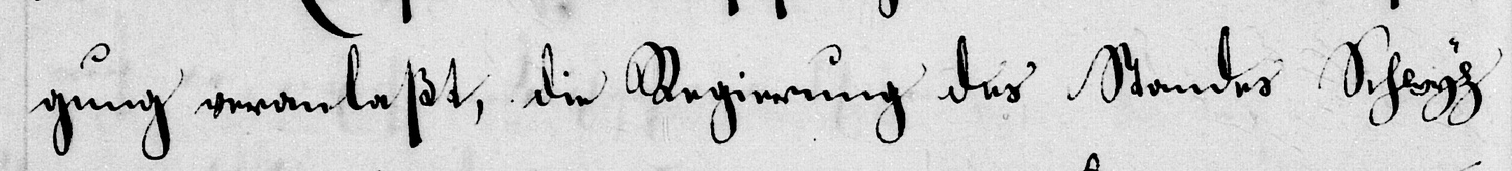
gung veranlaßt, die Regierung des Standes Schwyz
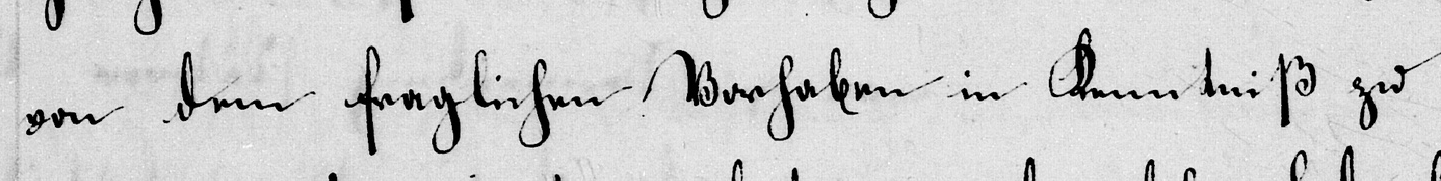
von dem fraglichen Vorhaben in Kenntniß zu
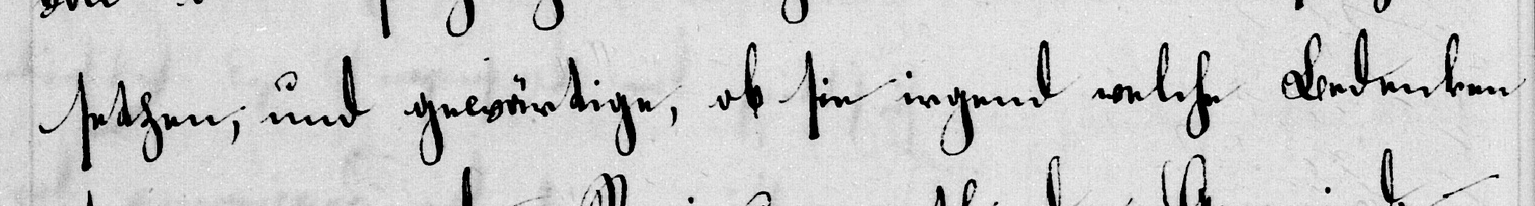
setzen, und gewärtige, ob sie irgend welche Bedenken
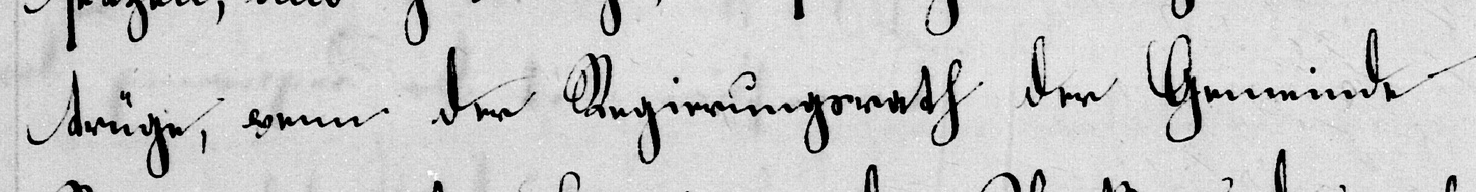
trüge, wenn der Regierungsrath der Gemeinde
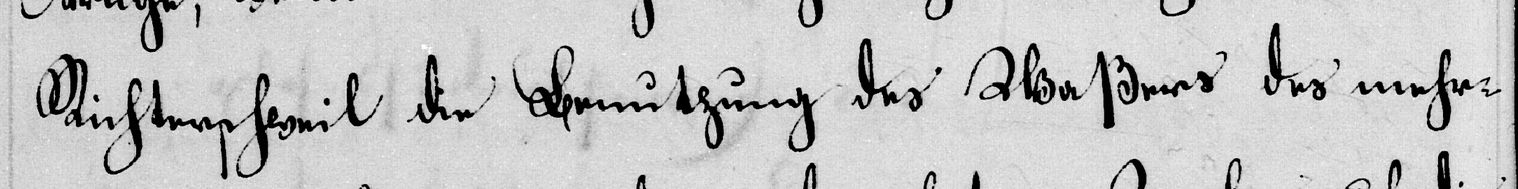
Richterschweil die Benutzung des Waßers des mehr¬
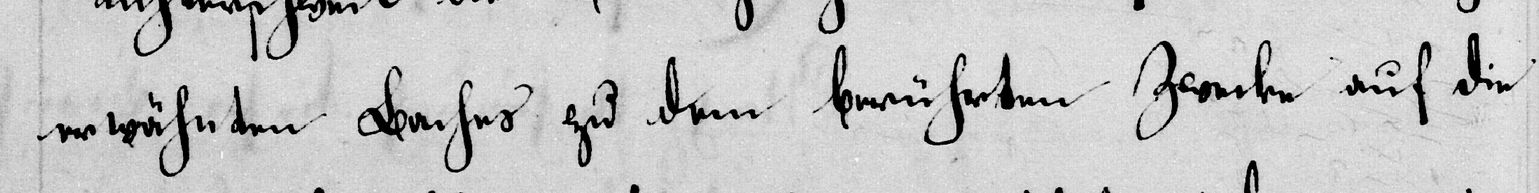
erwähnten Baches zu dem berührten Zwecke auf die
